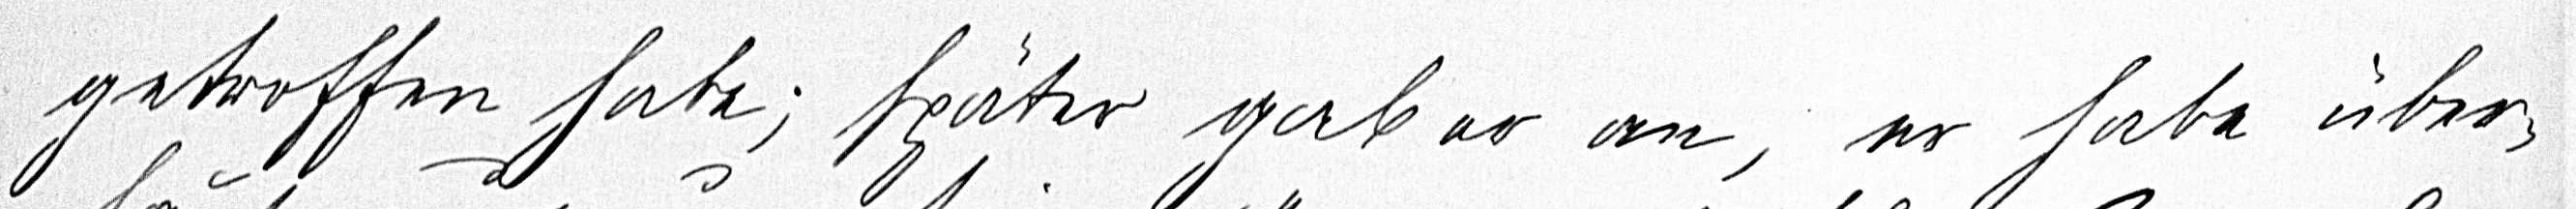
getroffen habe; später gab er an, er habe über¬
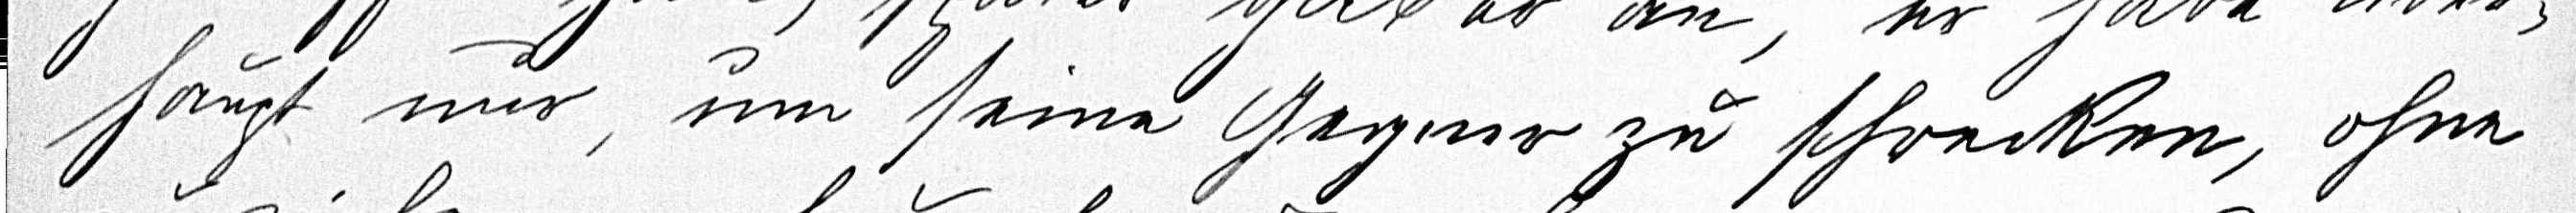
haupt nur, um seine Gegner zu schrecken, ohne
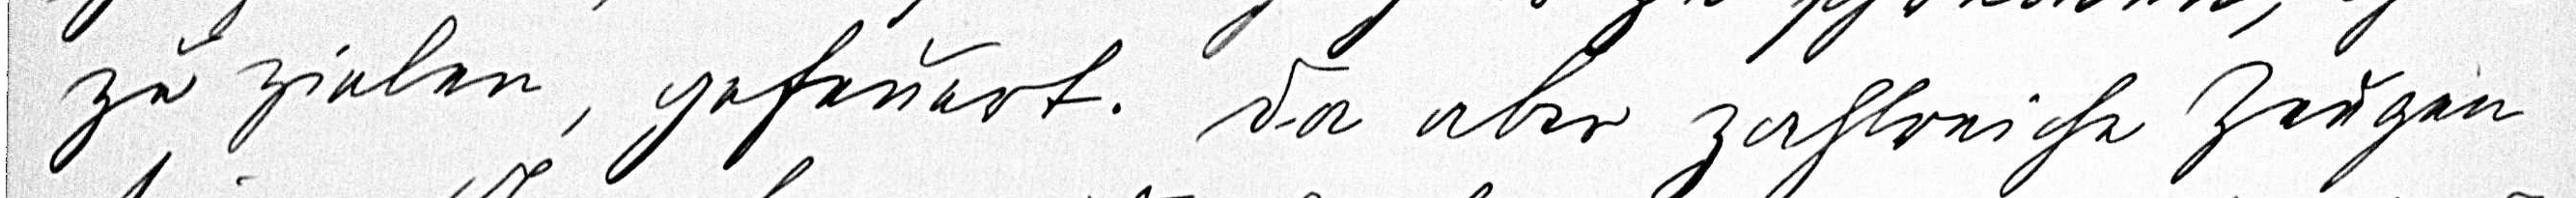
zu zielen, gefeuert. Da aber zahlreiche Zeugen
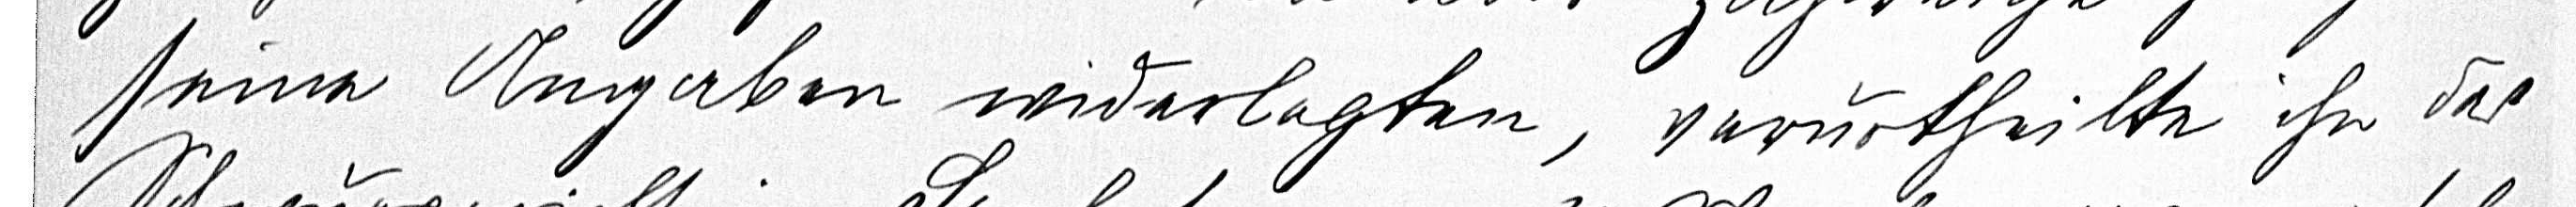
seine Angaben widerlegten, verurtheilte ihn das
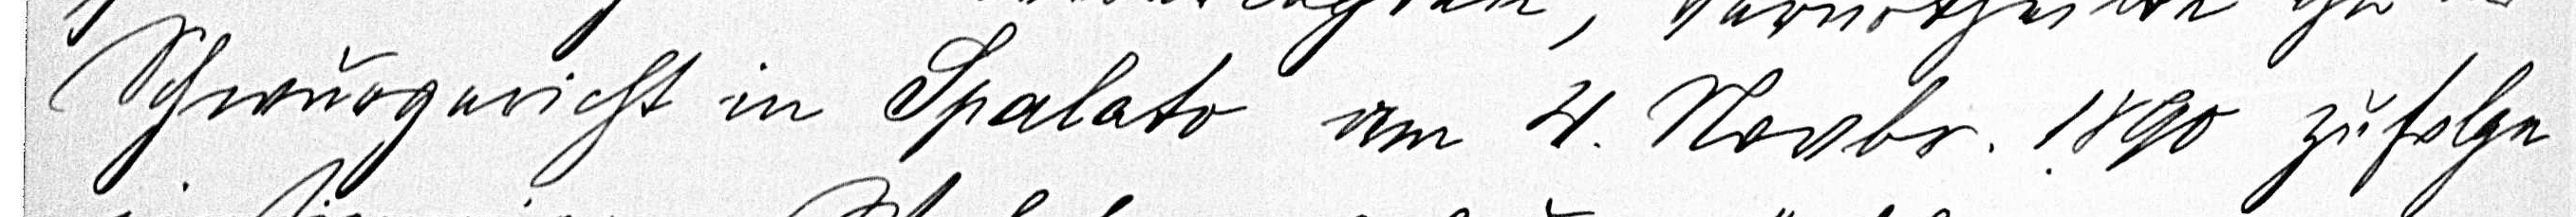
Schwurgericht in Spalato am 4. Novbr 1890 zufolge
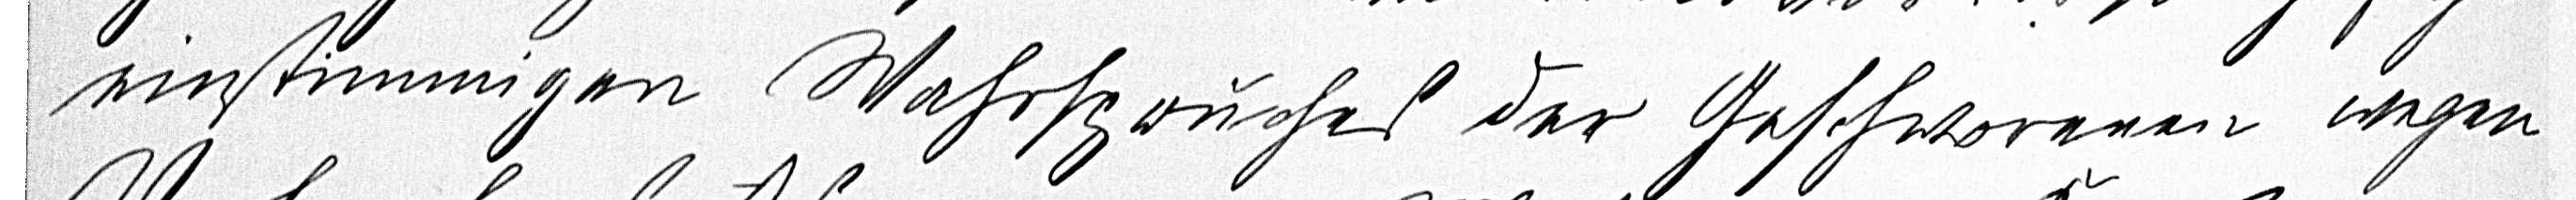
einstimmigen Wahrspruches der Geschworenen wegen
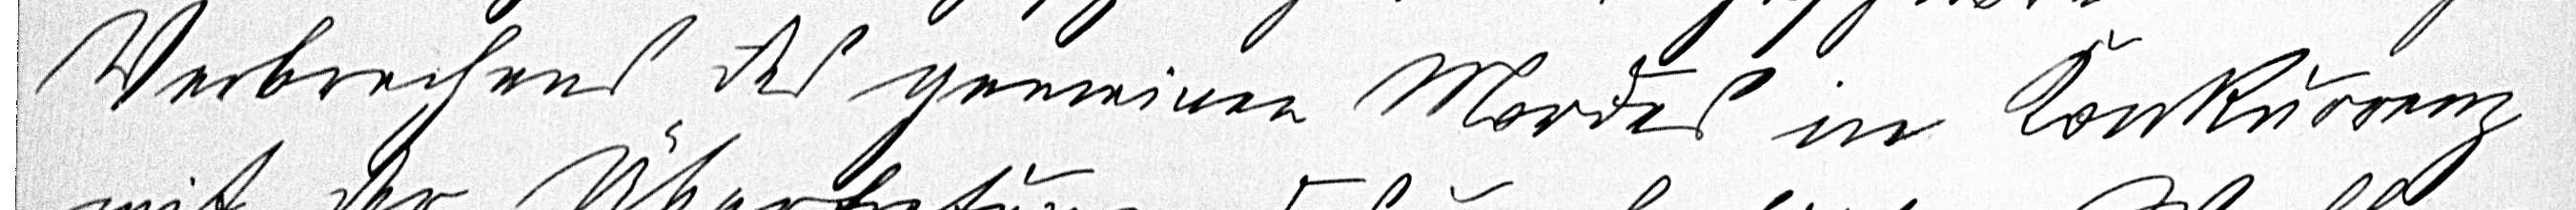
Verbrechens des gemeinen Mordes in Konkurrenz
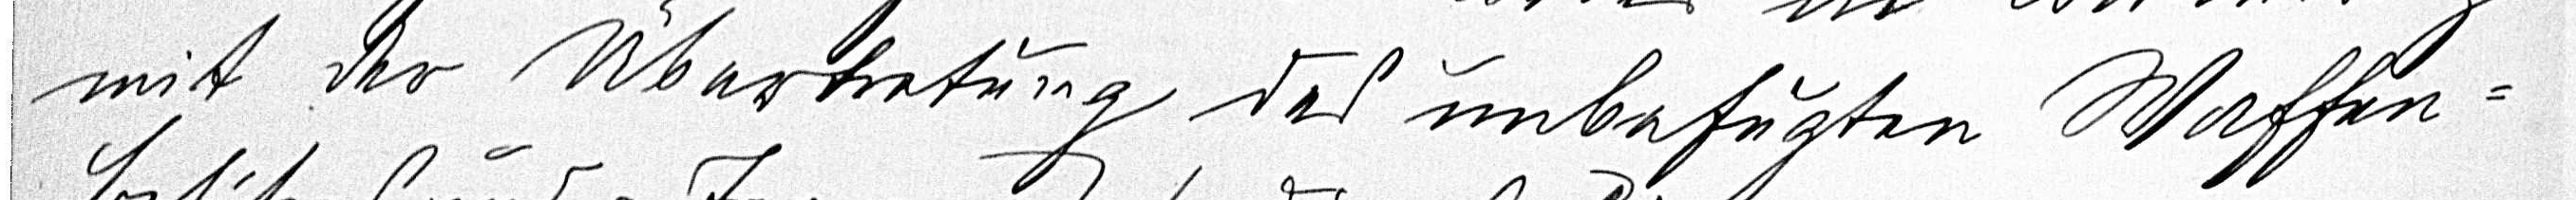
mit der Übertretung des unbefugten Waffen¬
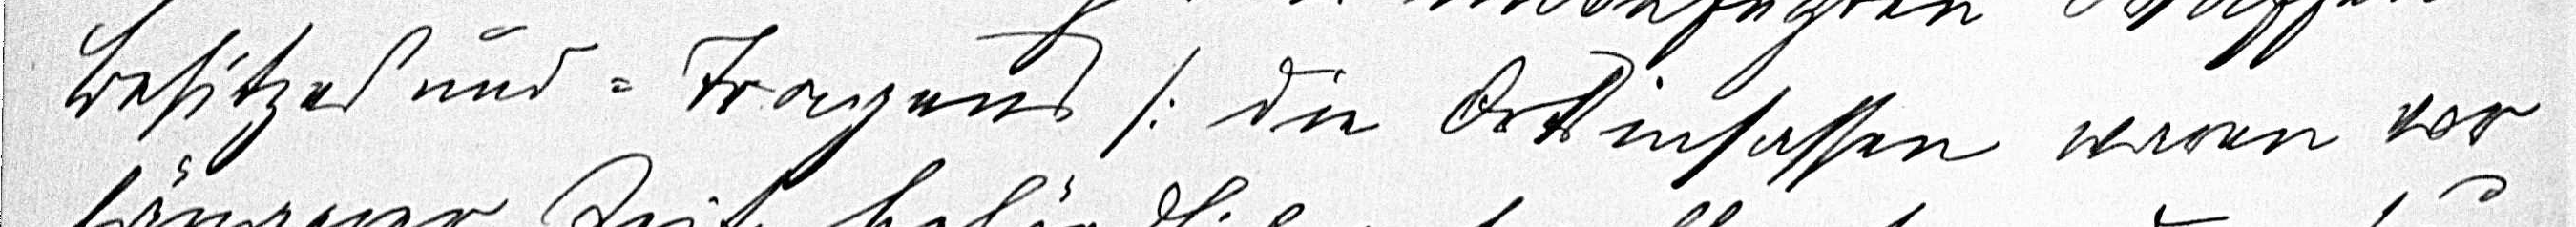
besitzes und- Tragens (die Ortsinsassen waren vor
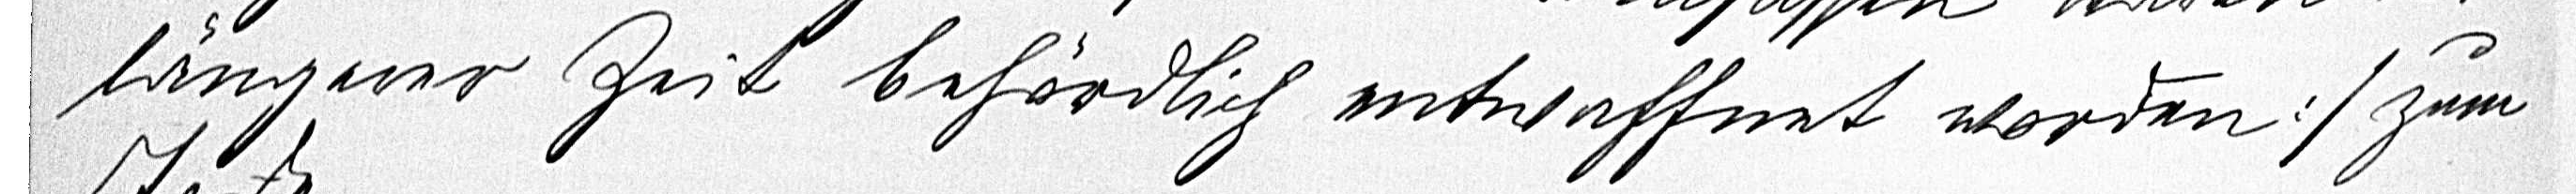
längerer Zeit behördlich entwaffnet worden) zum
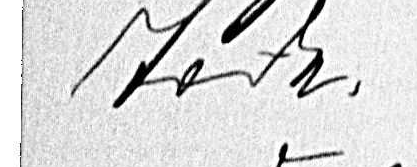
Tode.
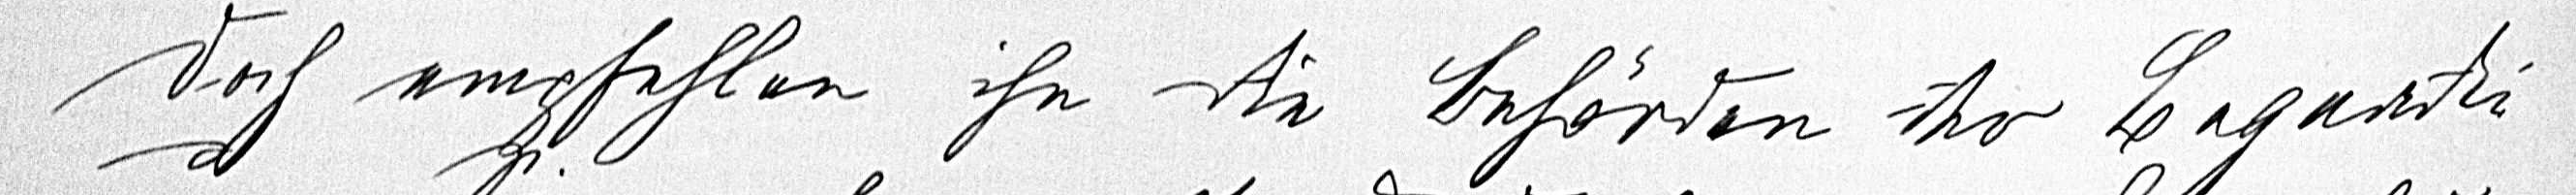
Doch empfehlen ihn die Behörden der Begnadi¬
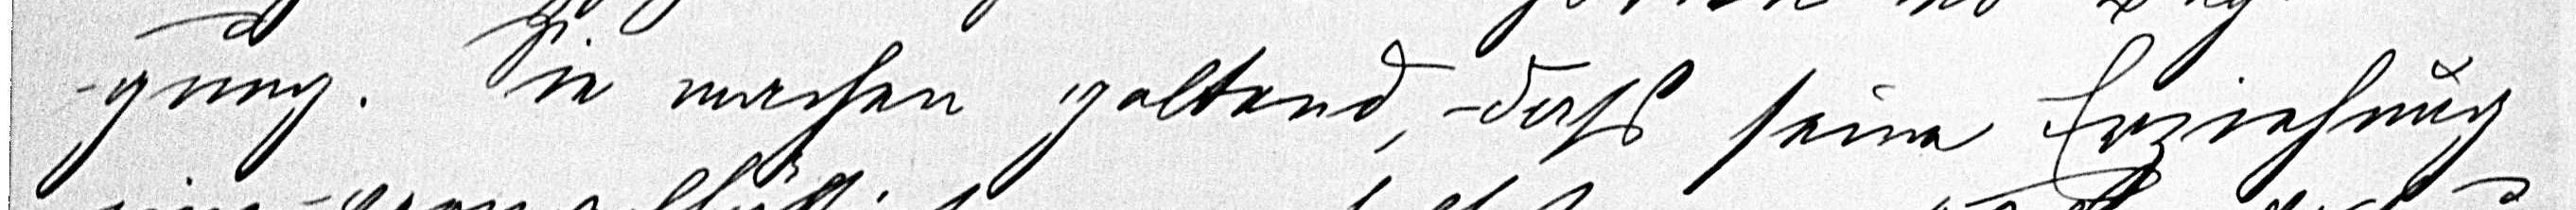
gung. Sie machen geltend, das seine Erziehung
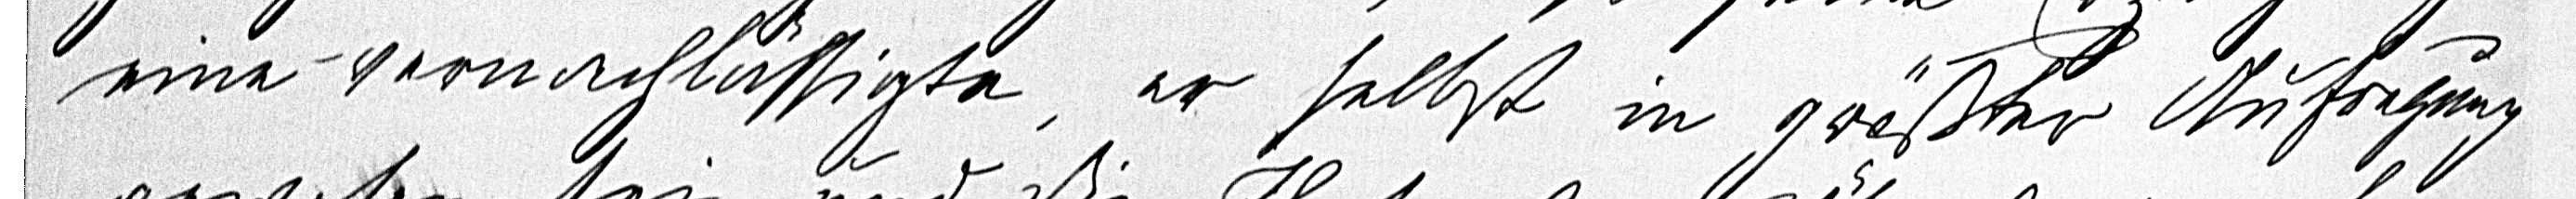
eine vernachlässigte, er selbst in größter Aufregung
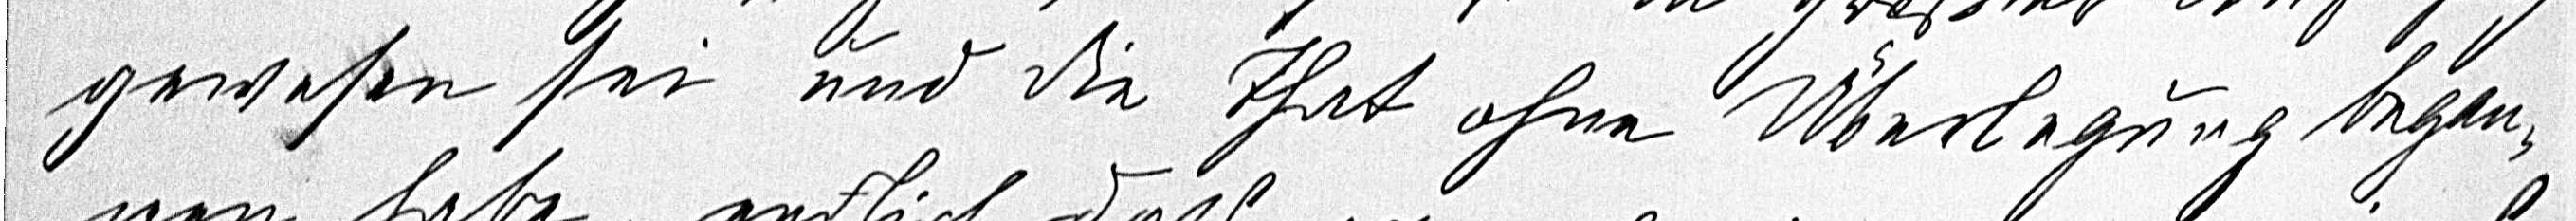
gewesen sei und die That ohne Überlegung began¬
